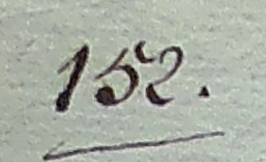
152.
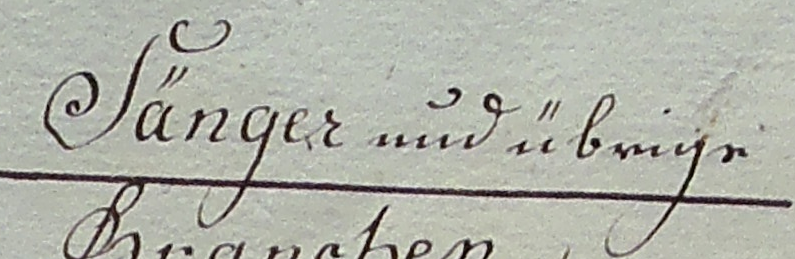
Sänger und übrige
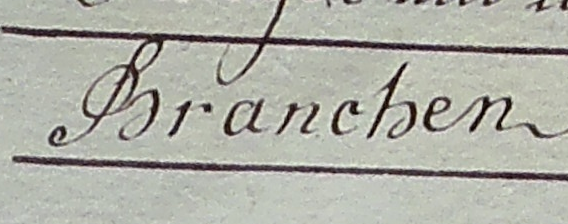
Branchen.
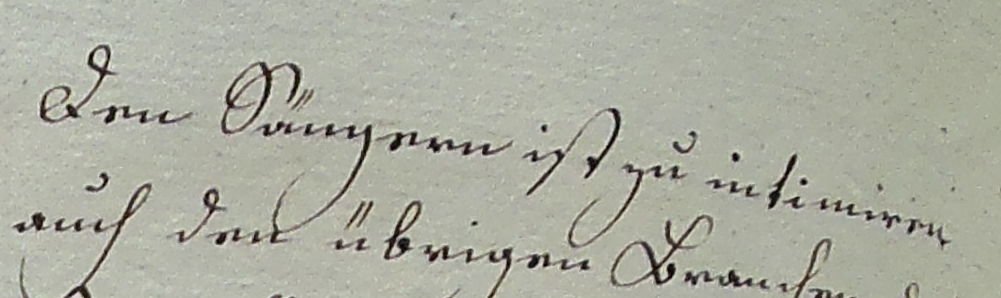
Den Sängern ist zu intimiren
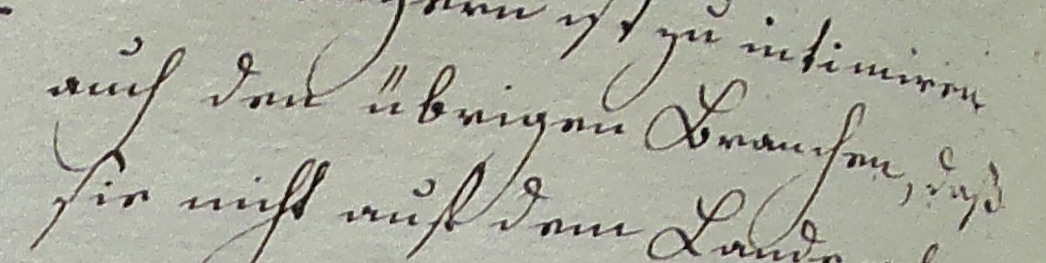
auch den übrigen Branchen, daß
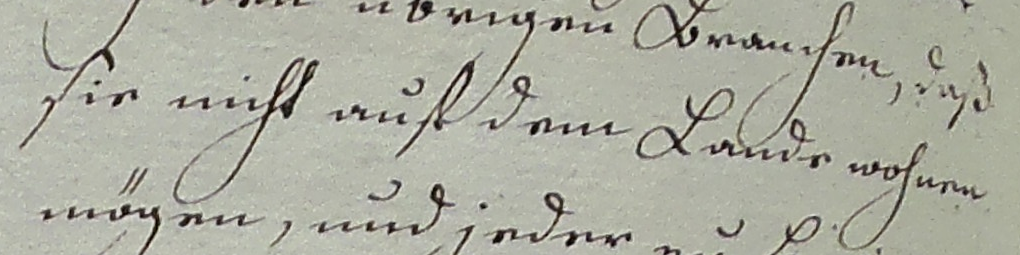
sie nicht auf dem Lande wohnen
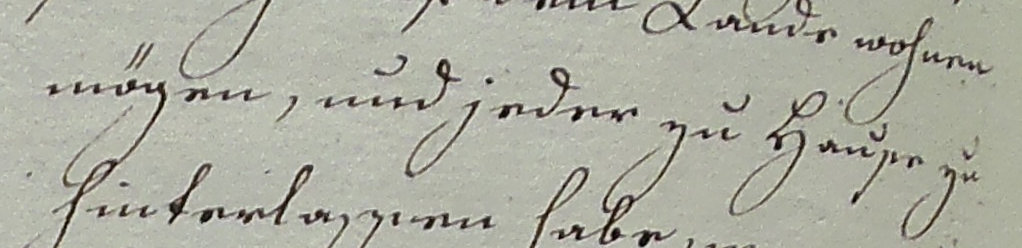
mögen, und jeder zu Hause zu
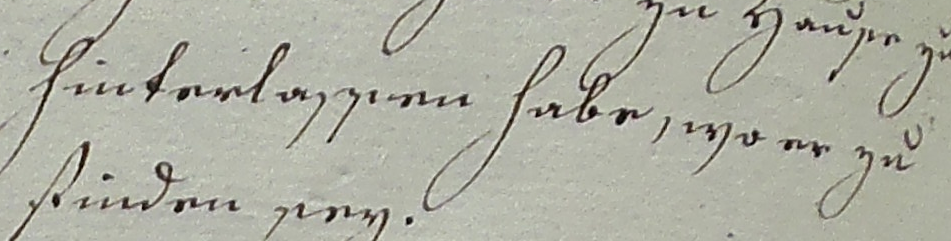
hinterlassen habe, wo er zu
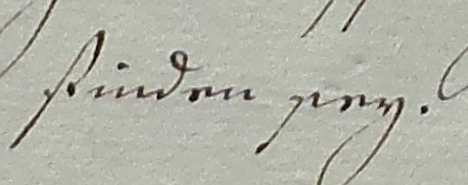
finden sey.
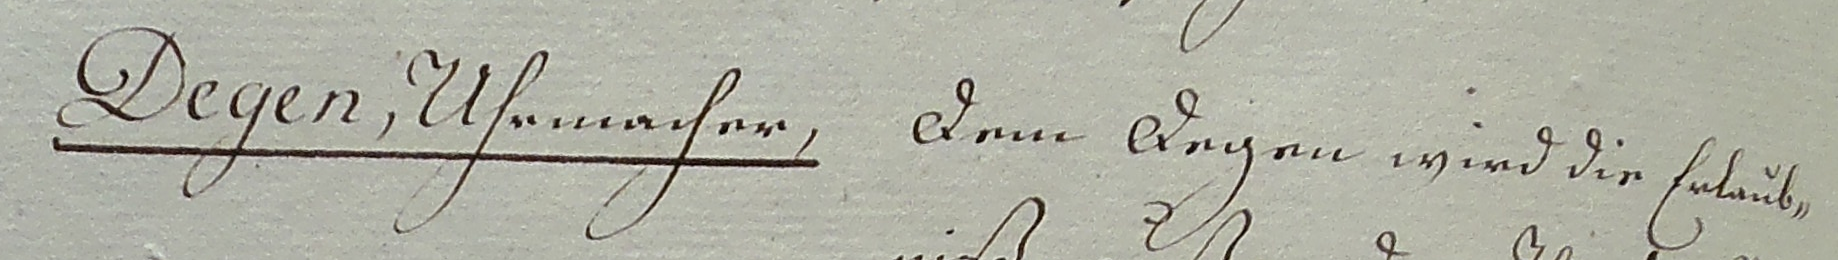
Degen, Uhrmacher, Dem Degen wird die Erlaub¬
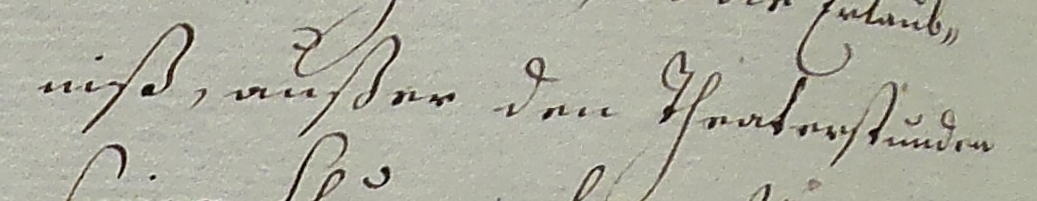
niß, außer den Theaterstunden
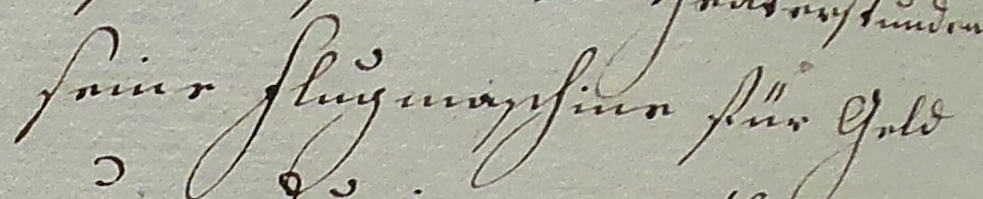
seine Flugmaschine für Geld
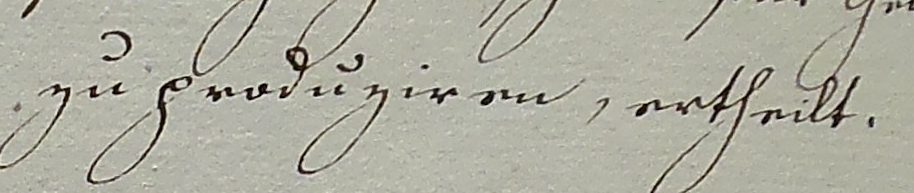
zu produziren, ertheilt.
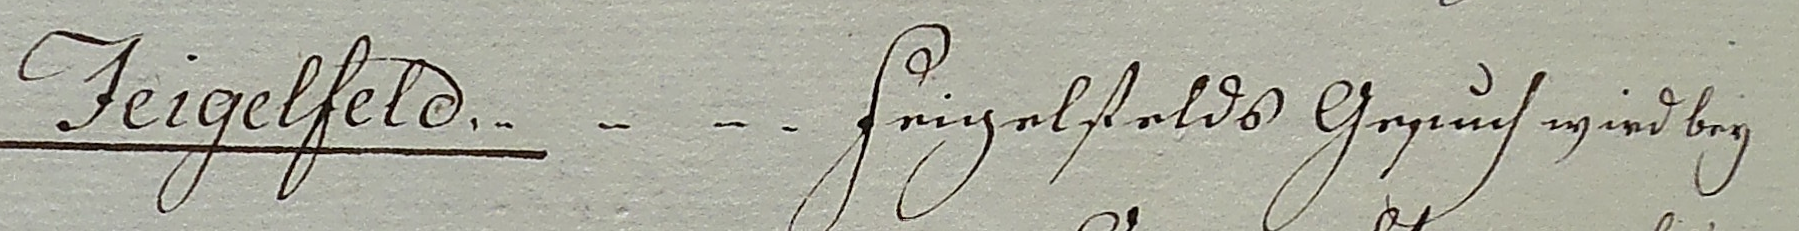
Feigelfeld. .. .. .. .. Feigelfelds Gesuch wird bey
